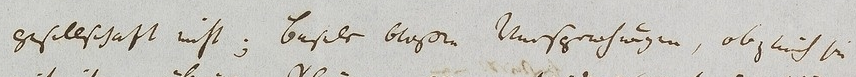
gesellschaft nicht; Basels bloßen Versprechungen, obgleich sie
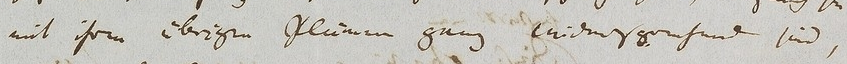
mit ihren übrigen Plänen ganz widersprechend sind,
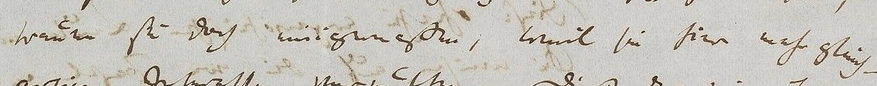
trauen sie doch einigermaßen, weil sie hier mehr gleich-
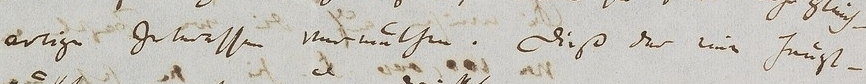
artige Interessen vermuthen. Dieß der eine Haupt-
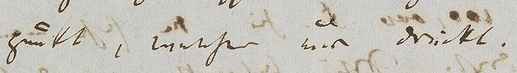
punkt, welcher uns drückt.
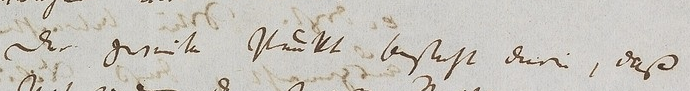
Der zweite Punkt besteht darin, daß
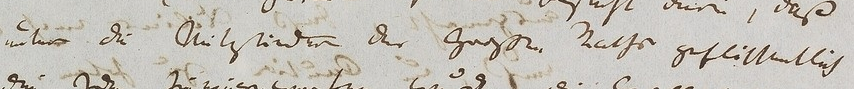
unter die Mitglieder des Großen Raths geflissentlich
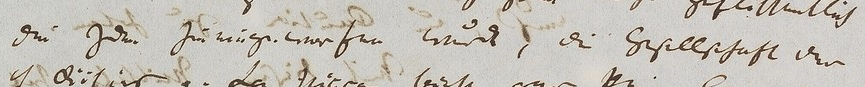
die Idee hineingeworfen wurde, die Gesellschaft der
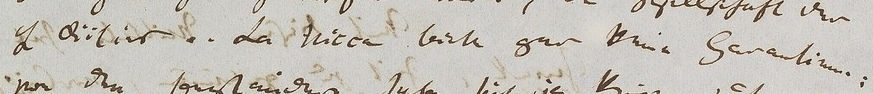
H. Kilias &. La Nicca biete gar keine Garantien:
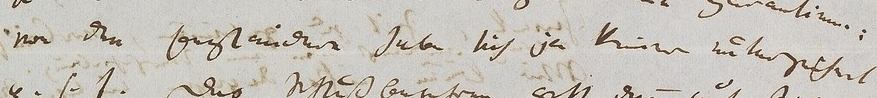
von den Engländern habe sich ja keiner unterzeichnet
